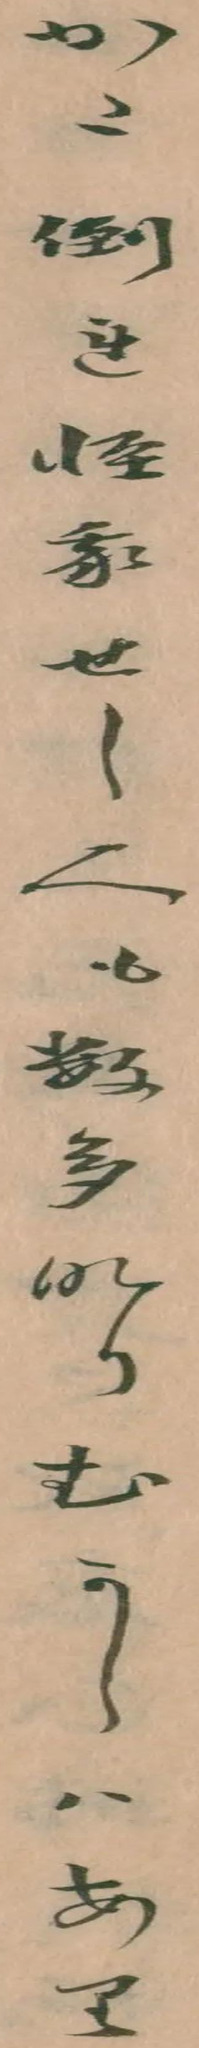かた倒れ怪我せし人も数多なりむかしはあり
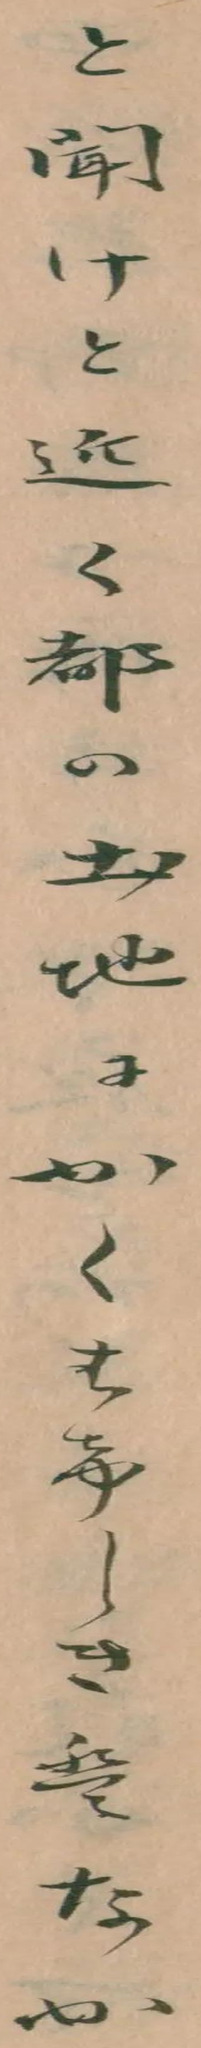と聞けと近く都の土地にかくはけしきはなか
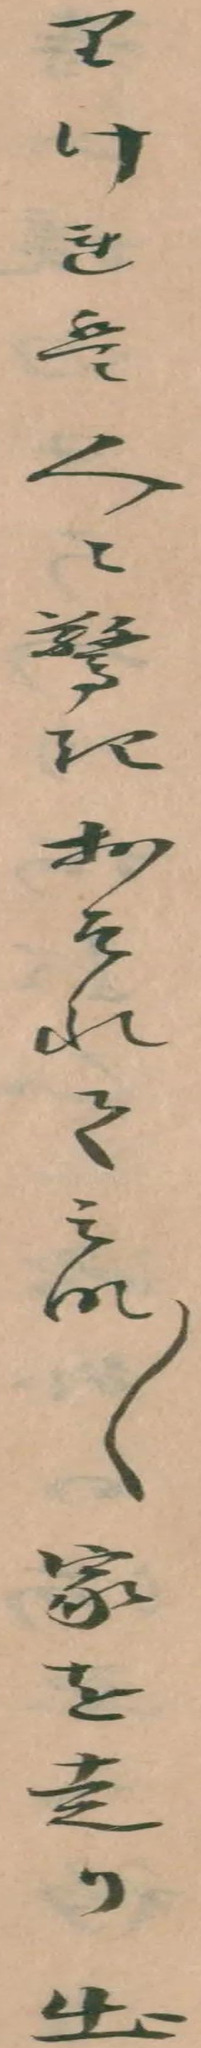りけれは人々驚きおそれてみな〳〵家を走り出
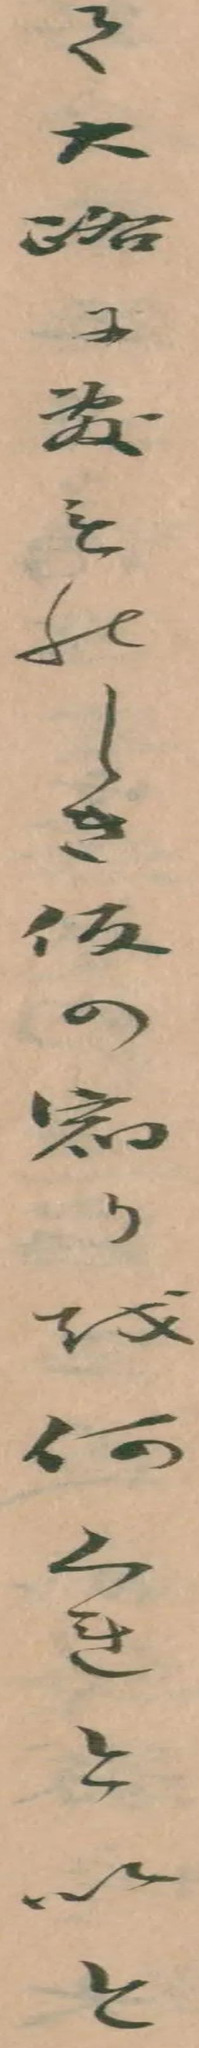て大路に敷ものしき仮の宿りを何くれといと

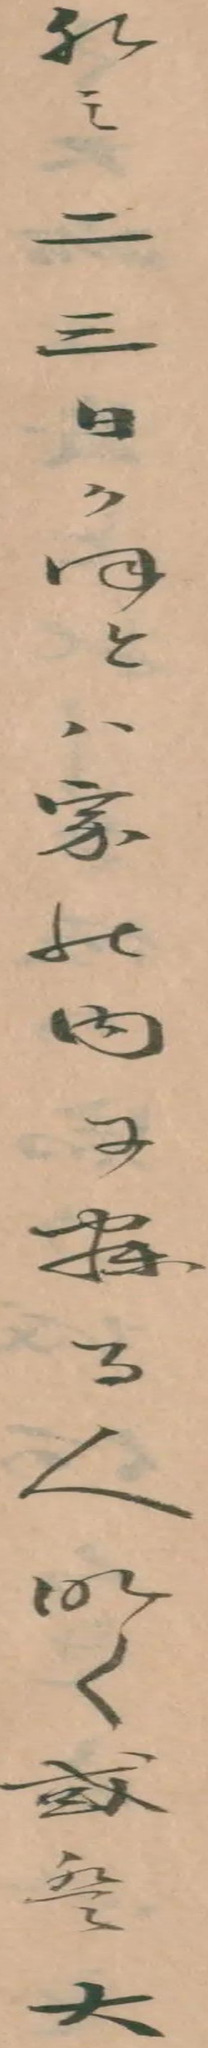なみ二三日かほとは家の内に寐る人なく或は大
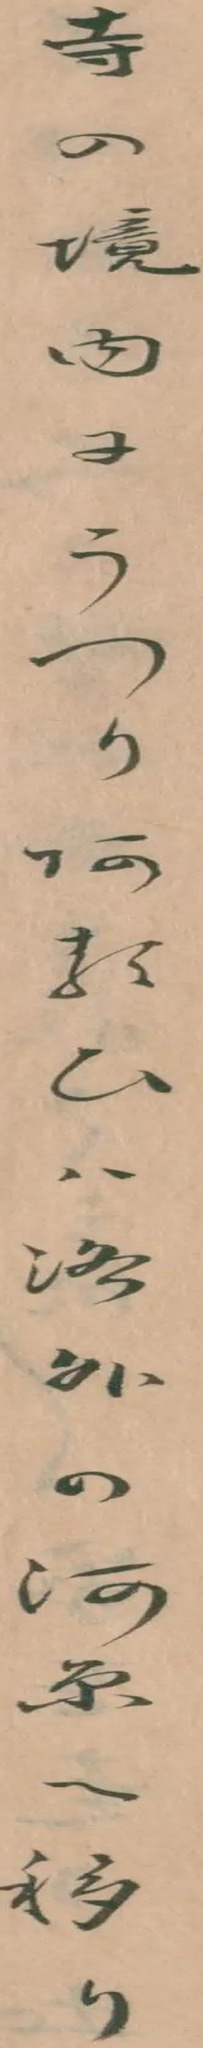寺の境内にうつりあるひは洛外の河原へ移り
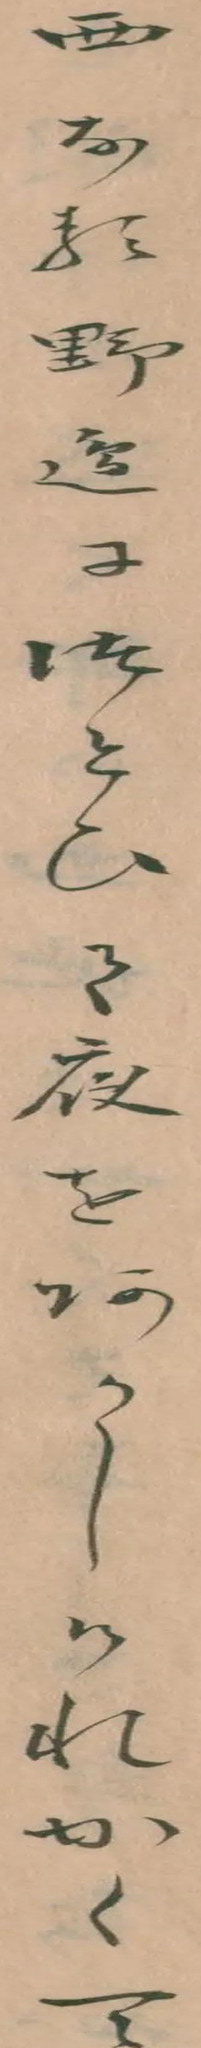西なる野辺につとひて夜をあかしけれかくて
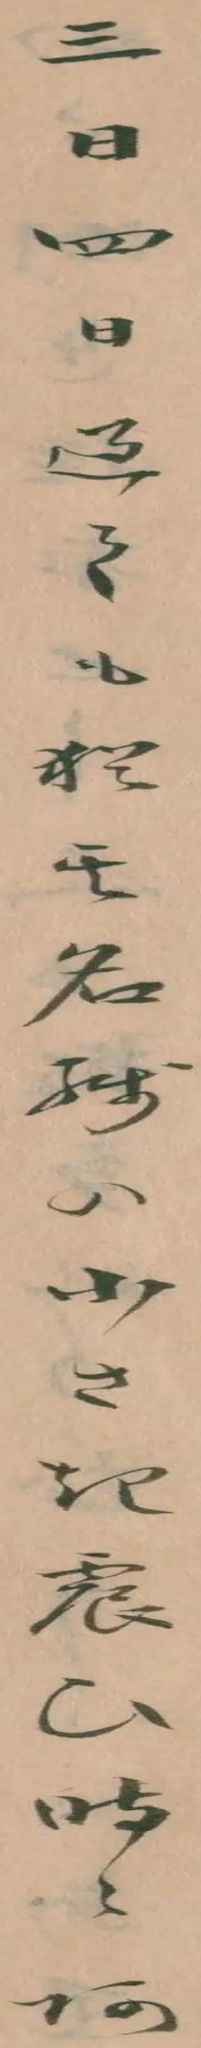三日四日過ても猶其名残の小さき震ひ時々あ
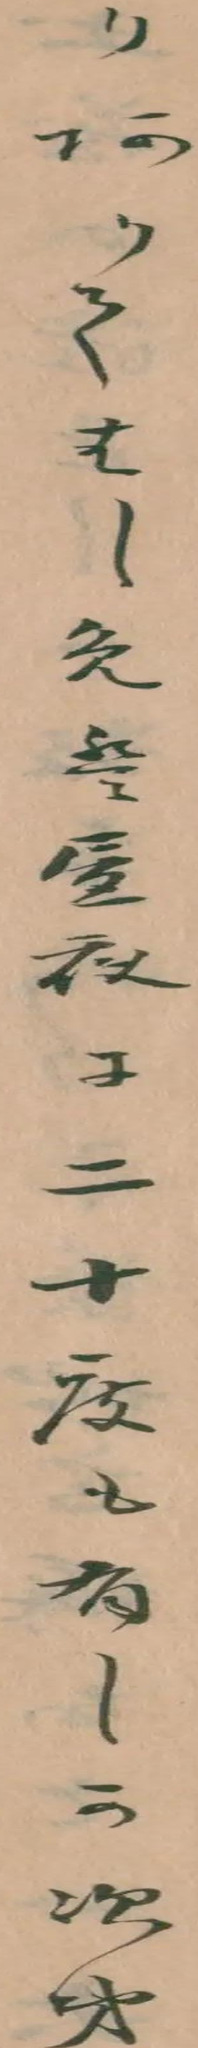りありてはしめは昼夜に二十度も有しか次第
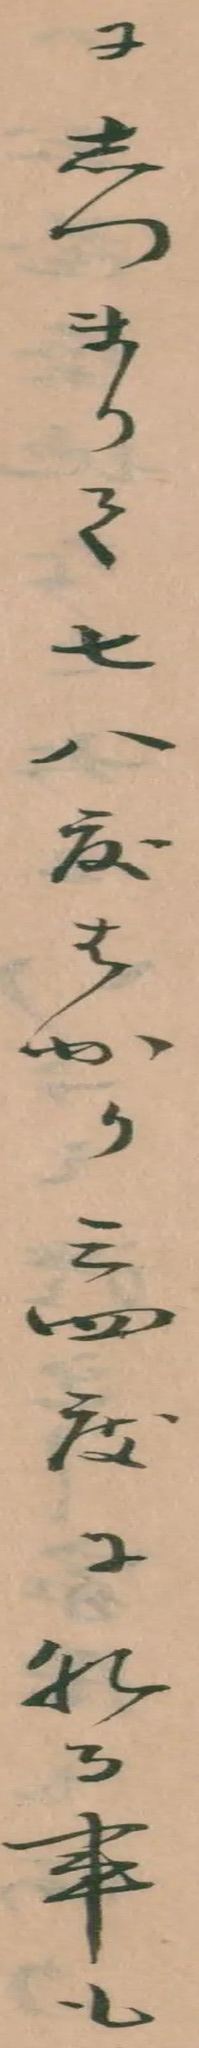にしつまりて七八度はかり三四度になる事も
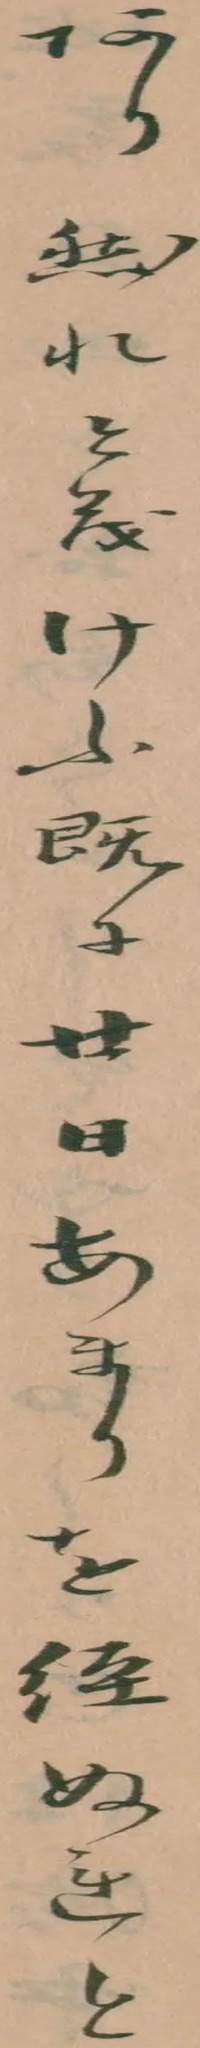あり然れともけふ既に廿日あまりを経ぬれと
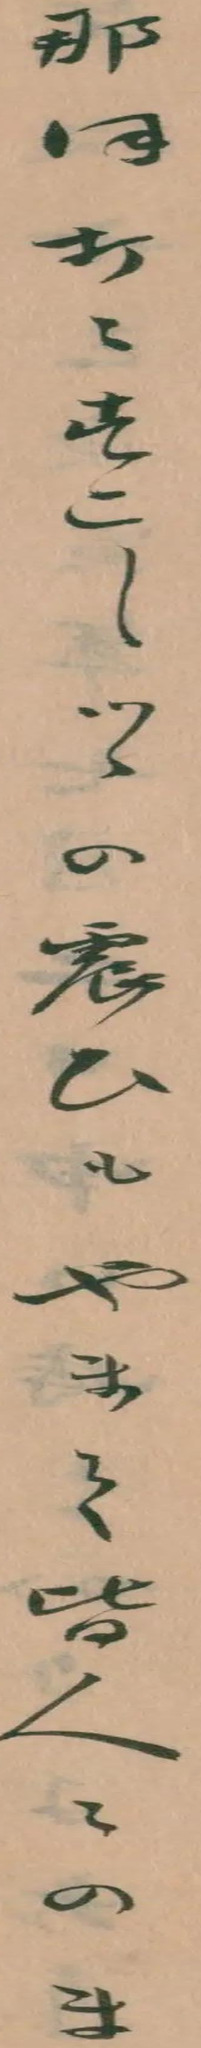なほ折々すこしつゝの震ひもやまて皆人々のま
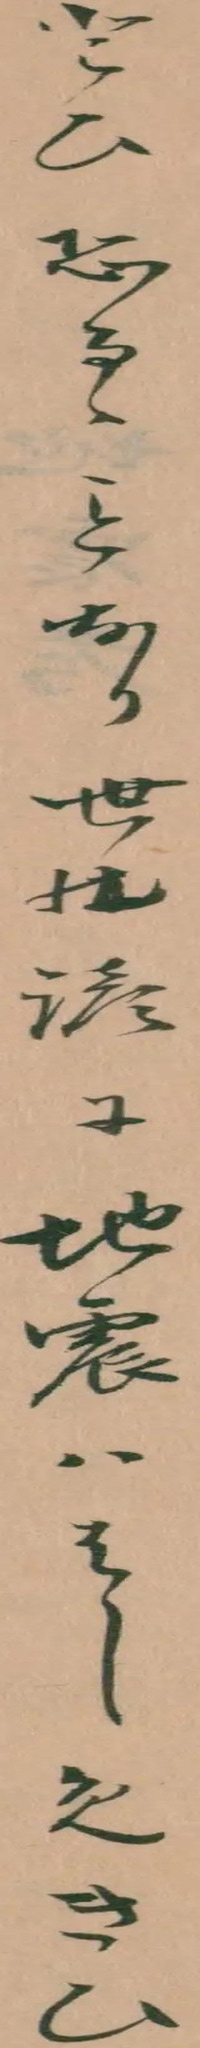とひ恐るゝことなり世の諺に地震ははしめきひ
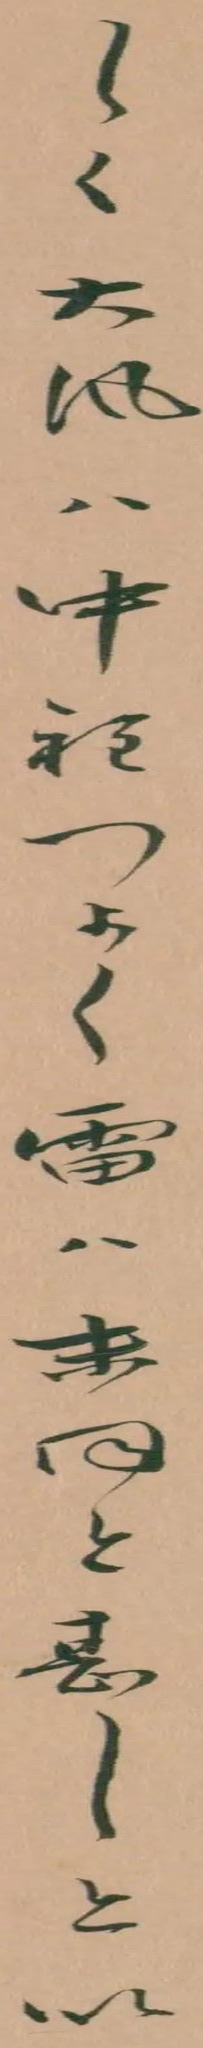しく大風は中程つよく雷は末ほと甚しとい
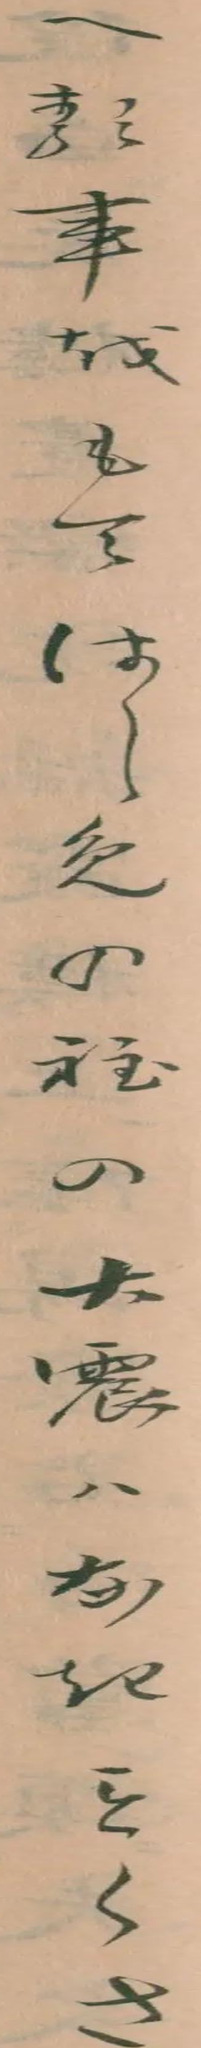へる事をもてはしめの程の大震はなきことくさ
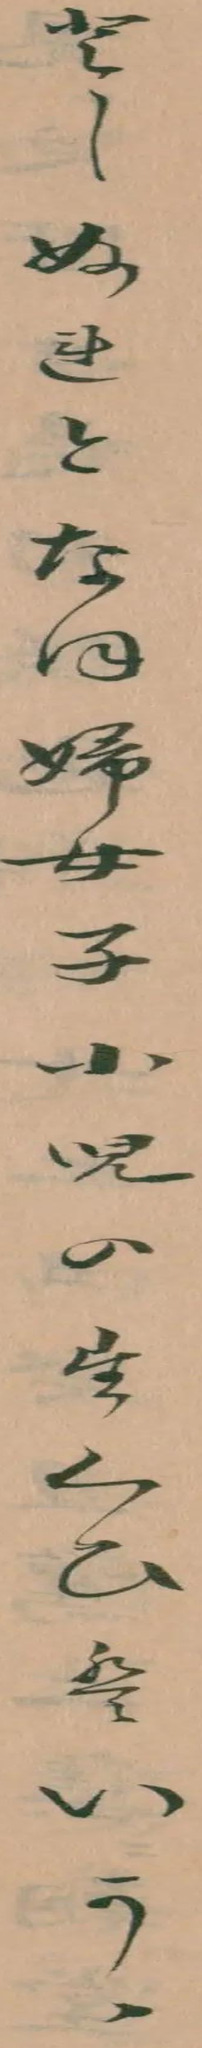としぬれとなほ婦女子小児のたくひはいかゝ
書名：地災撮要. 巻5-6(地震之部)
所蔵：国立国会図書館 National Diet Library, JAPAN
